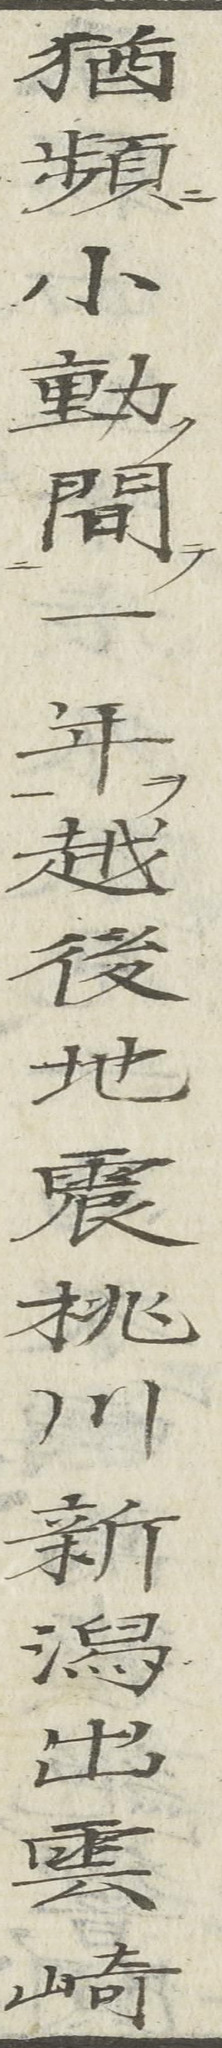猶頻小動間一年越後地震挑川新潟出雲崎
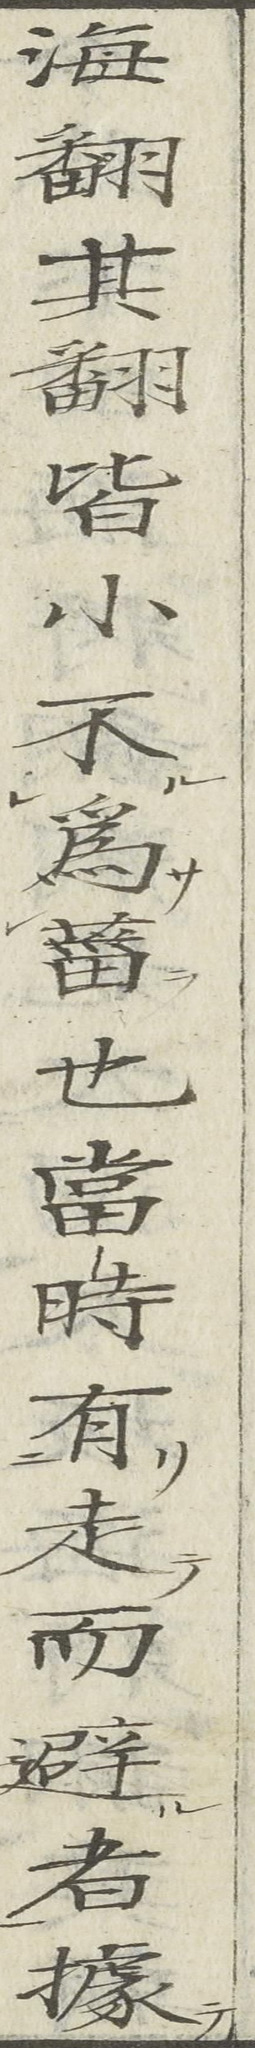海翻其翻皆小不為菑也当時有走而避者據
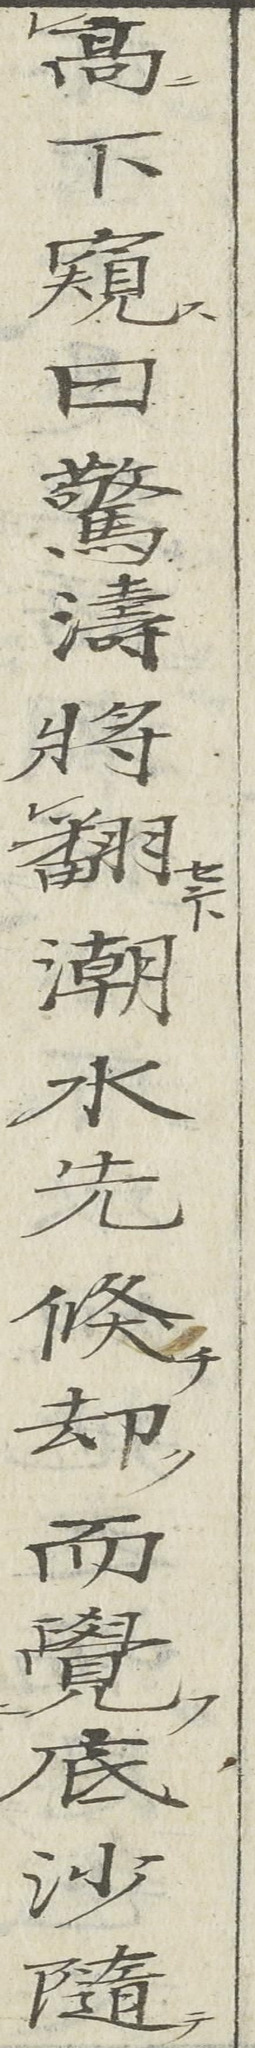高下窺曰驚濤将翻潮水先倐却而覚底沙随
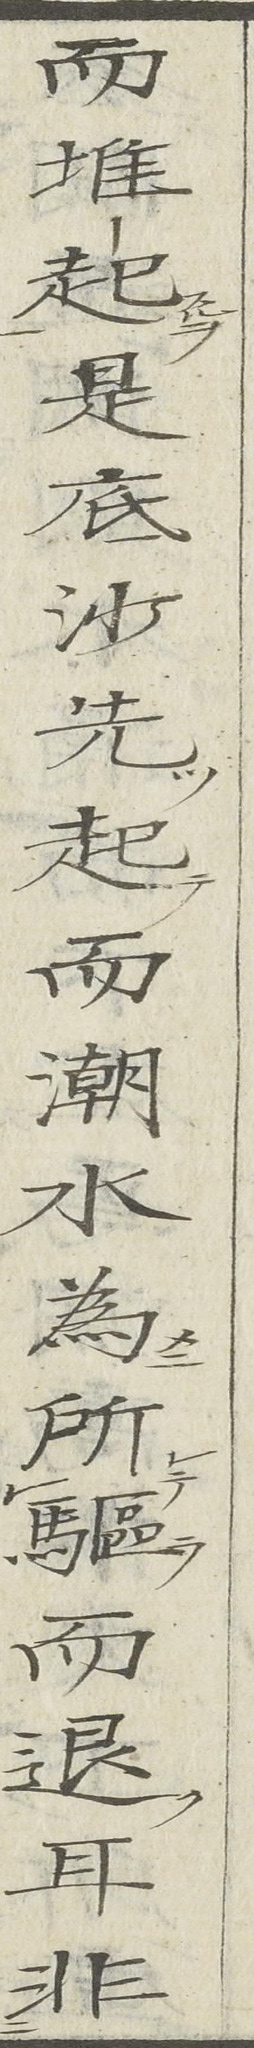而堆起是底沙先起而潮水為所駆而退耳非
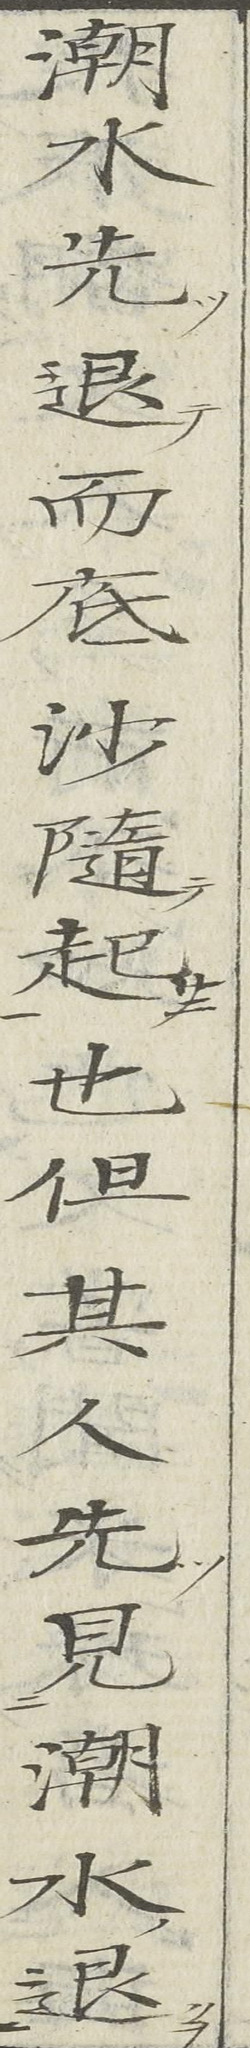潮水先退而底沙随起也但其人先見潮水退
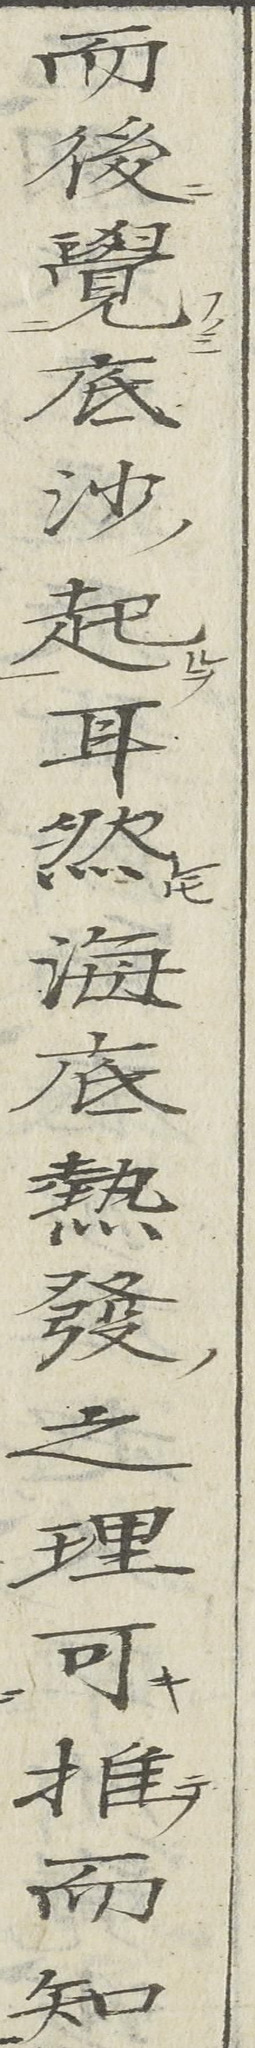而後覚底沙起耳然海底熱発之理可推而知

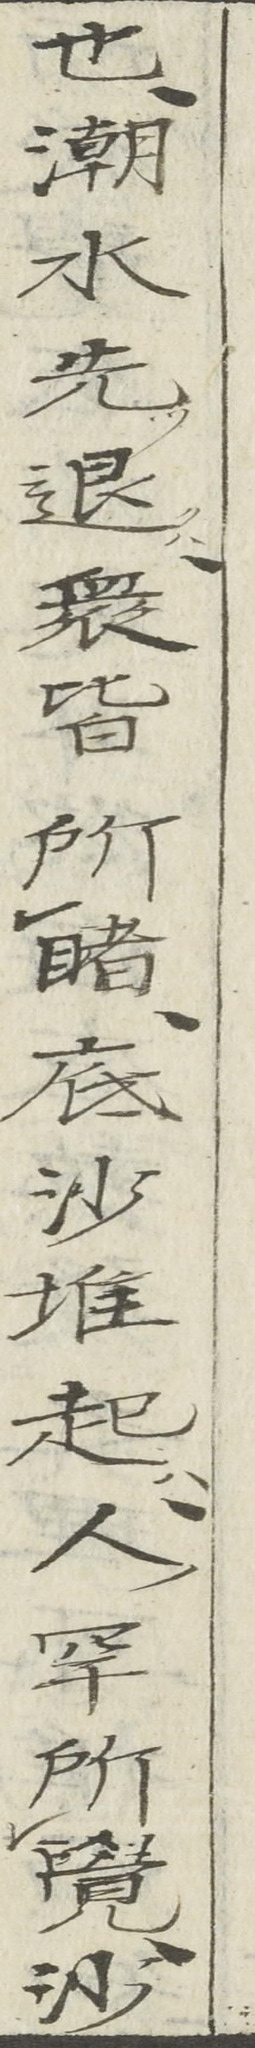也、潮水先退、衆皆所暗、底沙堆起、人罕所覚、沙
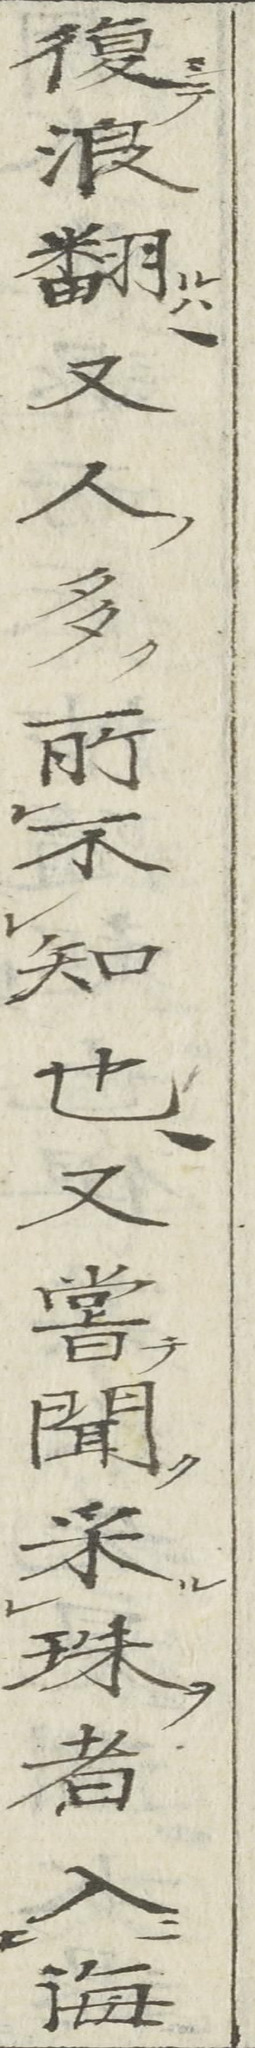復浪翻、又人多所知也、又嘗聞采珠者入海
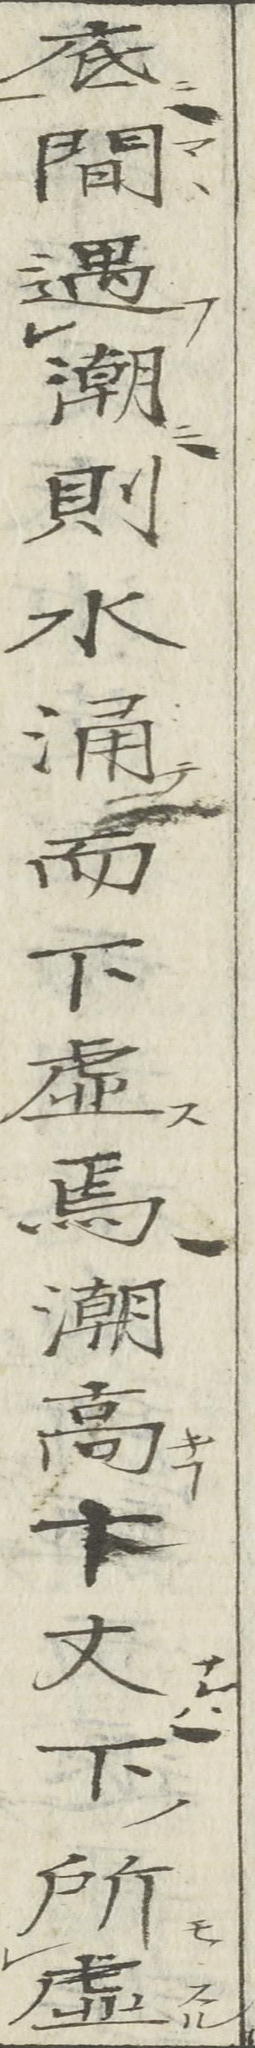底、間遇潮則水涌而下虚焉、潮高下丈、下所虚
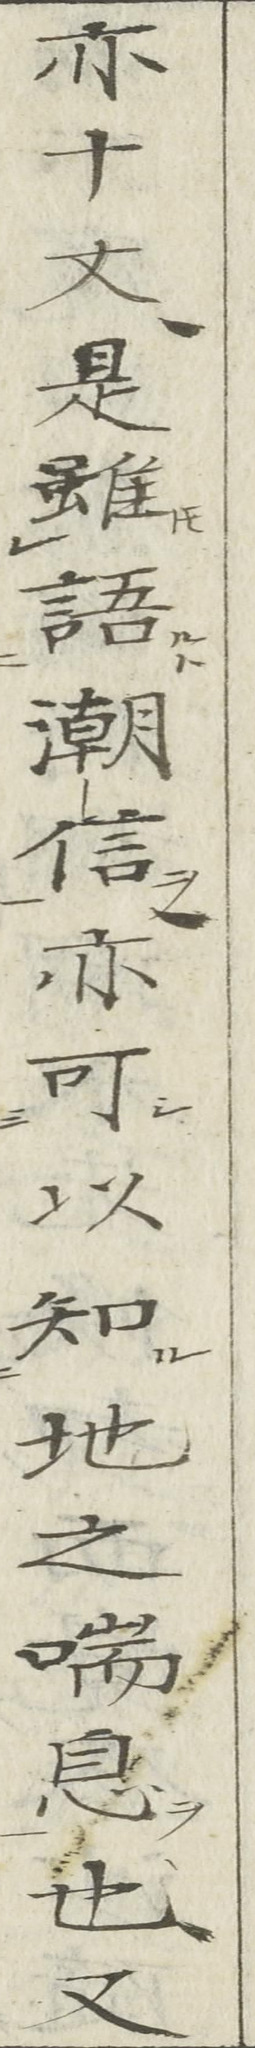亦十丈、是難語潮信、亦可以知地之喘息也、又
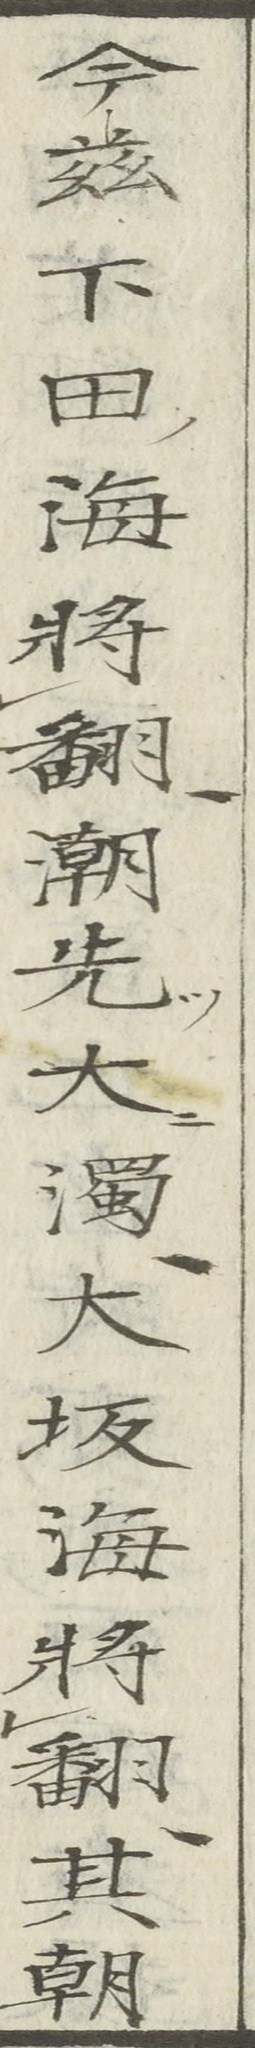今茲下田海将翻、潮先大濁、大坂海将翻、其朝
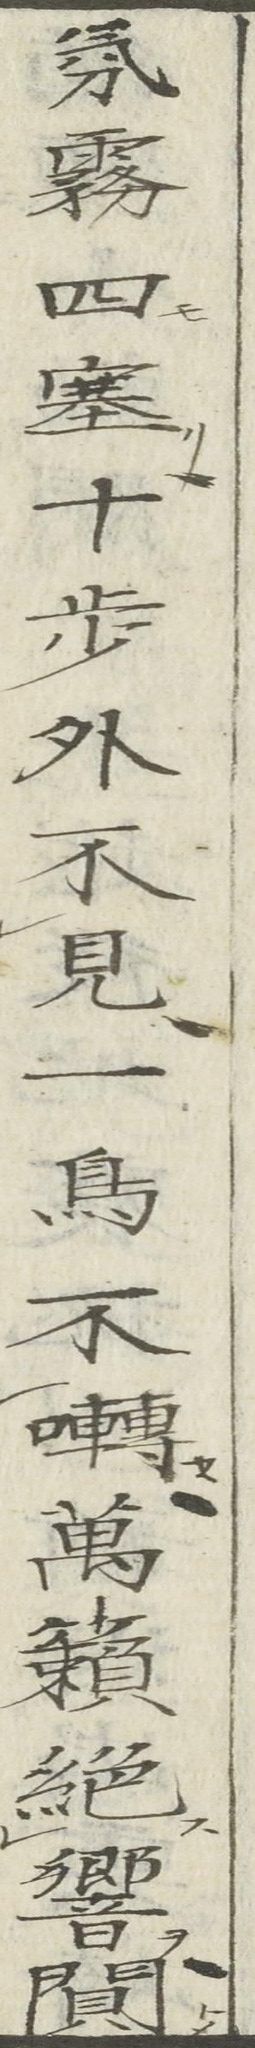氛霧四塞、十歩外不見、一鳥不囀、萬籟絶響、閴
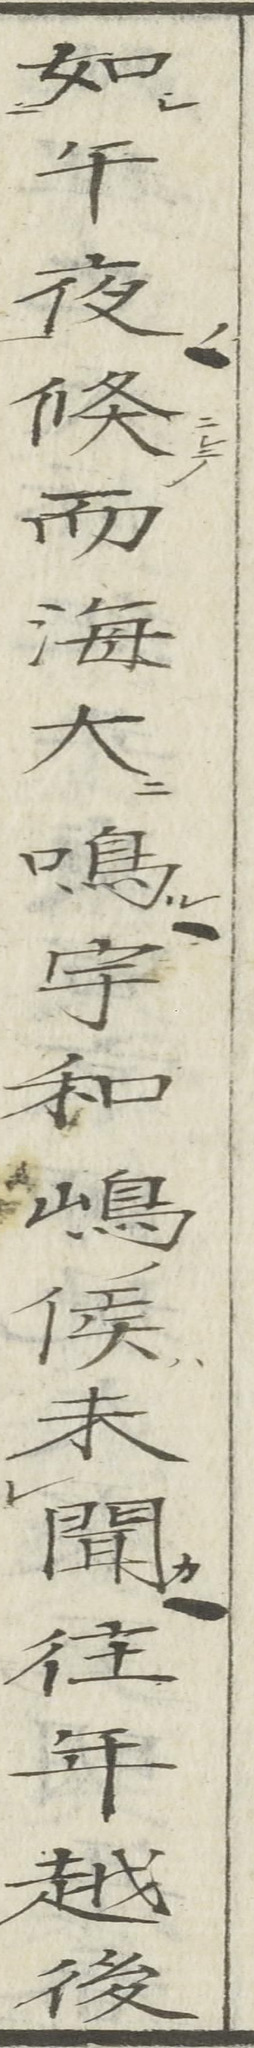如午夜、倐而海大鳴、宇和嶋侯未聞、往年越後
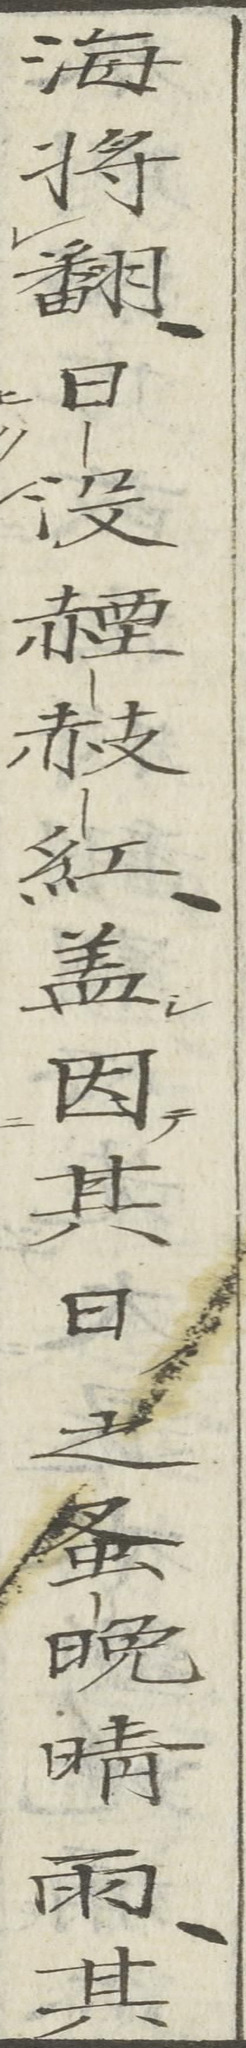海将翻、日没𧹬𧹛紅、蓋因其日之蚤晩晴雨、其
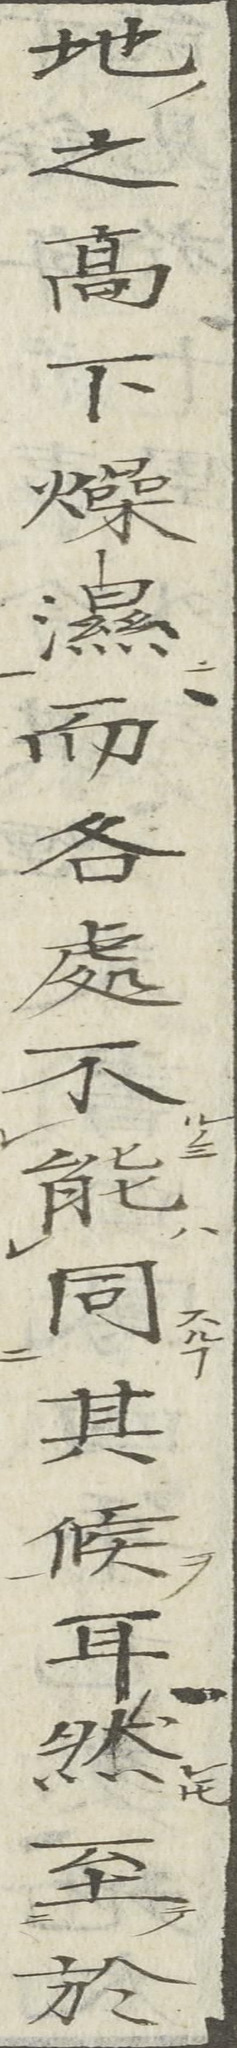地之高下燥濕、而各処不能同其候耳、然至於
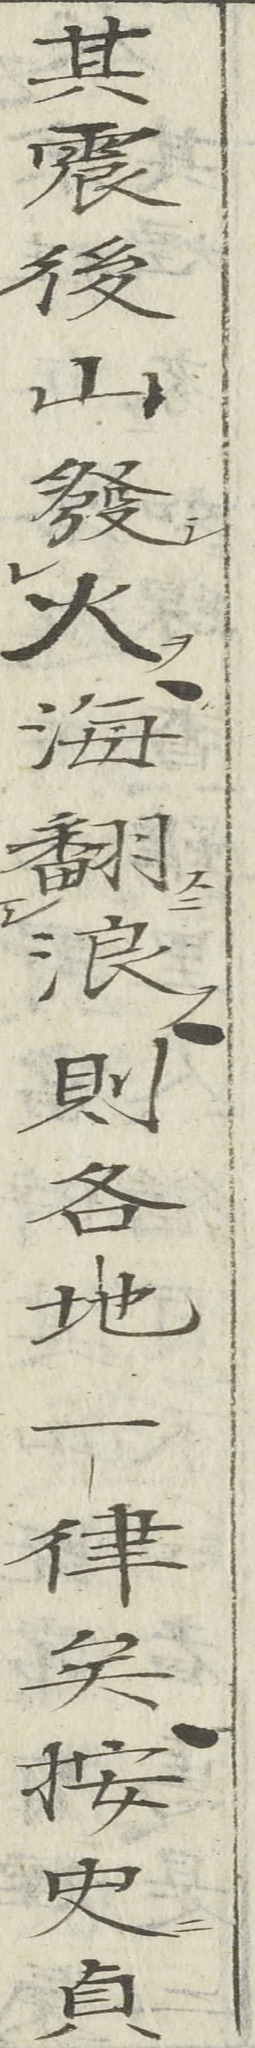其震後山発火、海翻浪、則各地一律矣、按史貞
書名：海翻考　全
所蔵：東京大学地震研究所図書室 Earthquake Research Institute Library, The University of Tokyo, JAPAN
